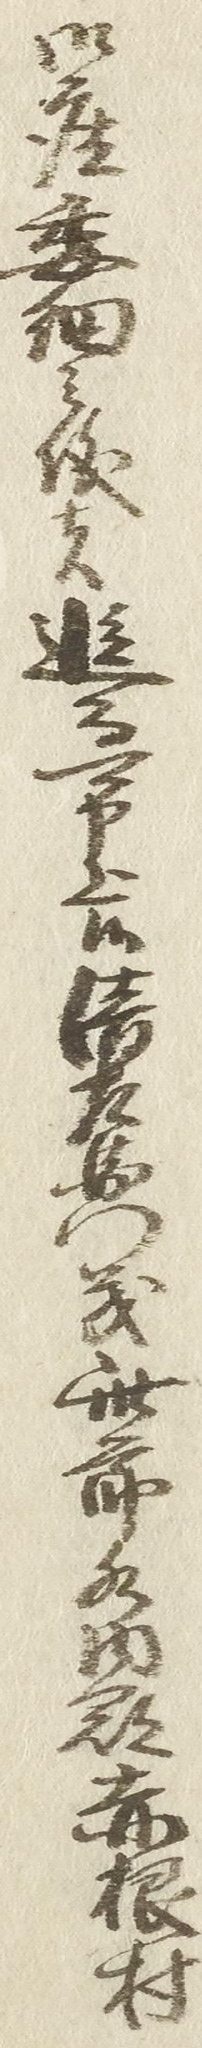御座委細之儀は追々可申上候清左衛門義此節水内郡赤根村
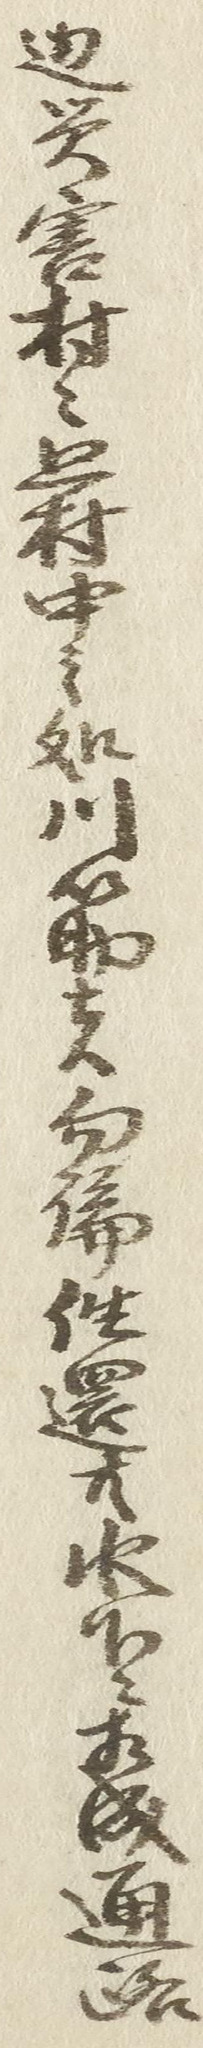辺災害村々廻村中之処川筋は勿論往還共水下二相成通路
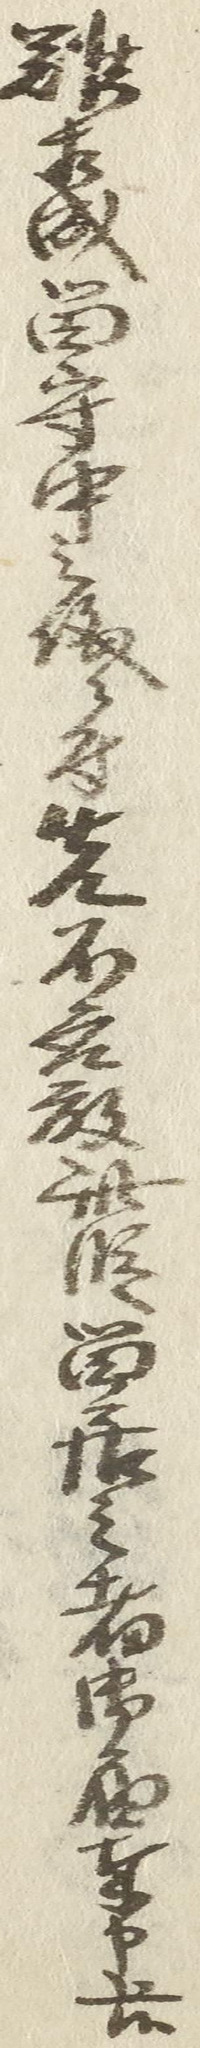難相成留守中之儀二付先不取敢此段留居之者御届奉申上候
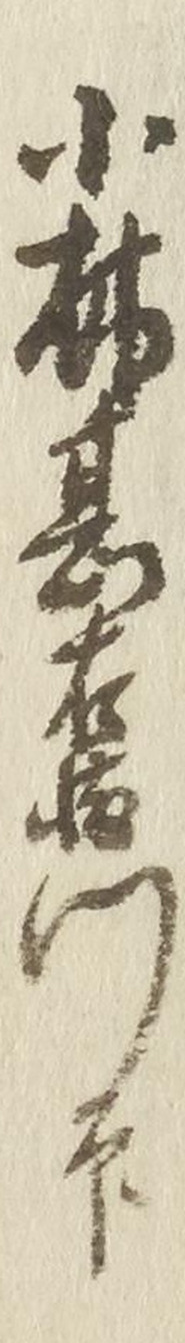小林甚右衛門印
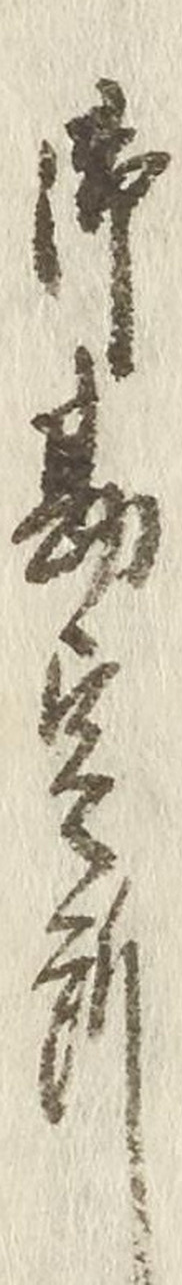御勘定所
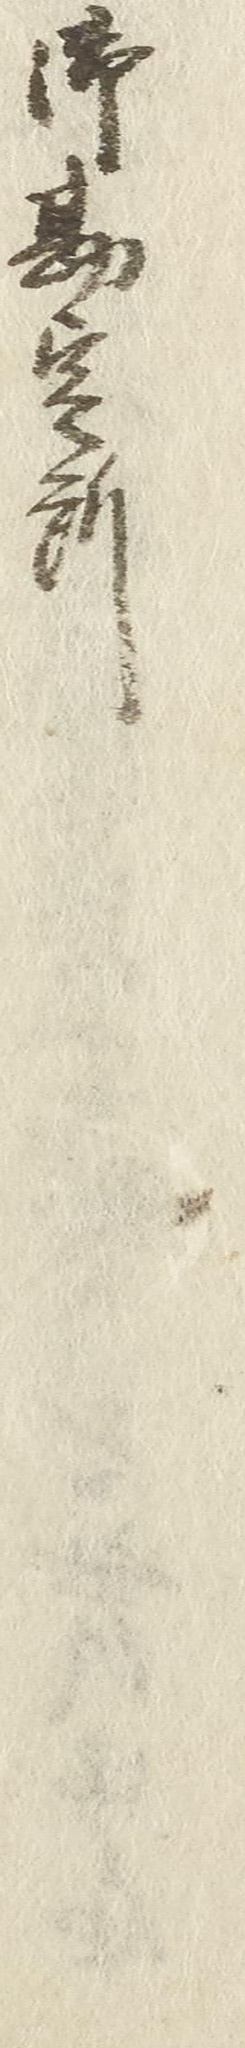御勘定所

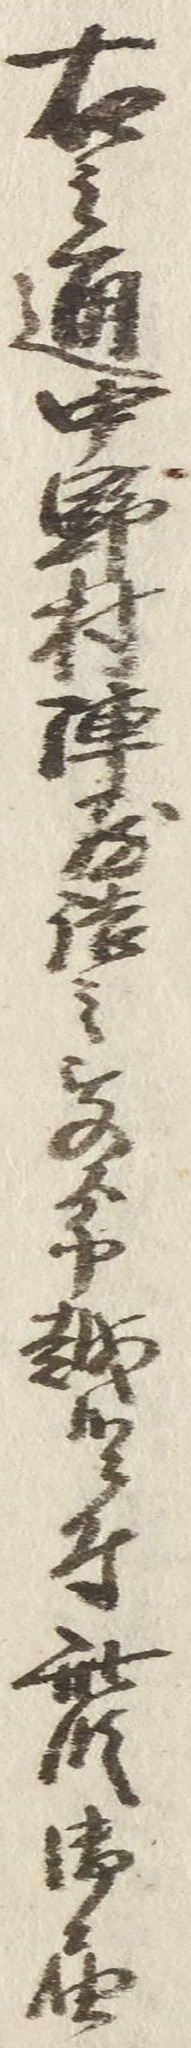右之通中野村陣屋詰之者ゟ申越候二付此段
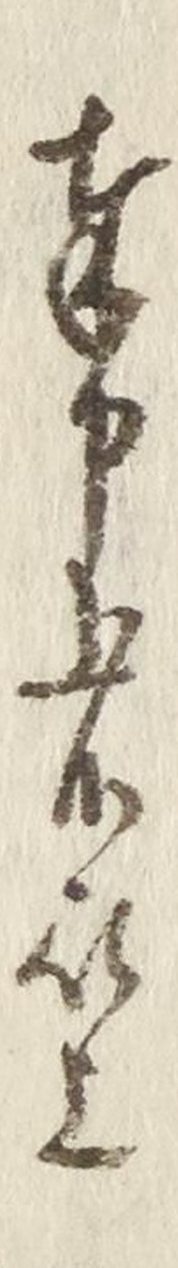奉申上候以上
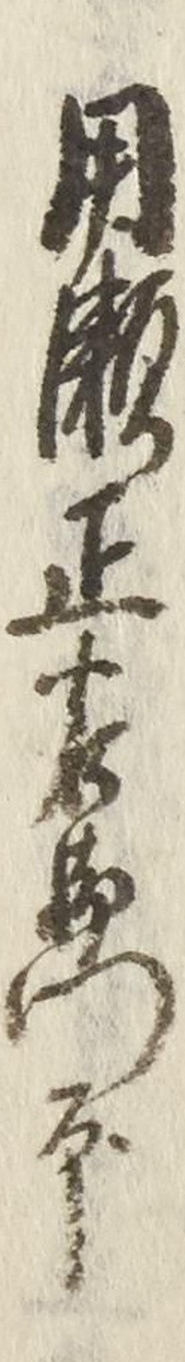用瀬正左衛門
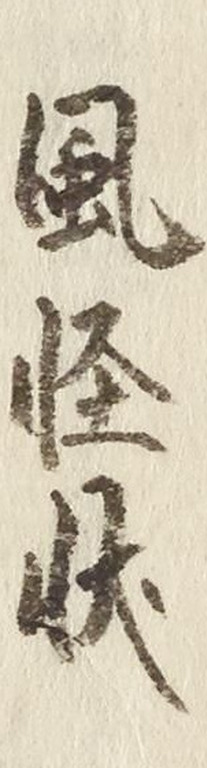風怪状
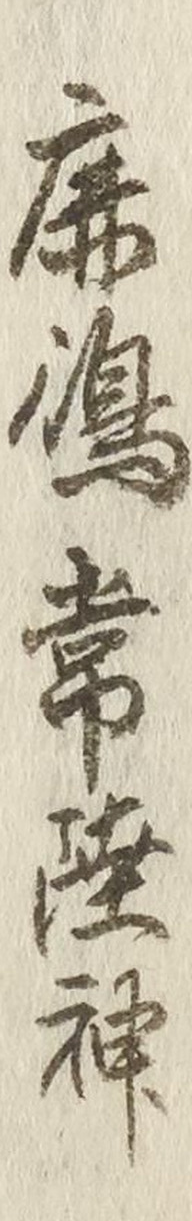廉嶋常陸神
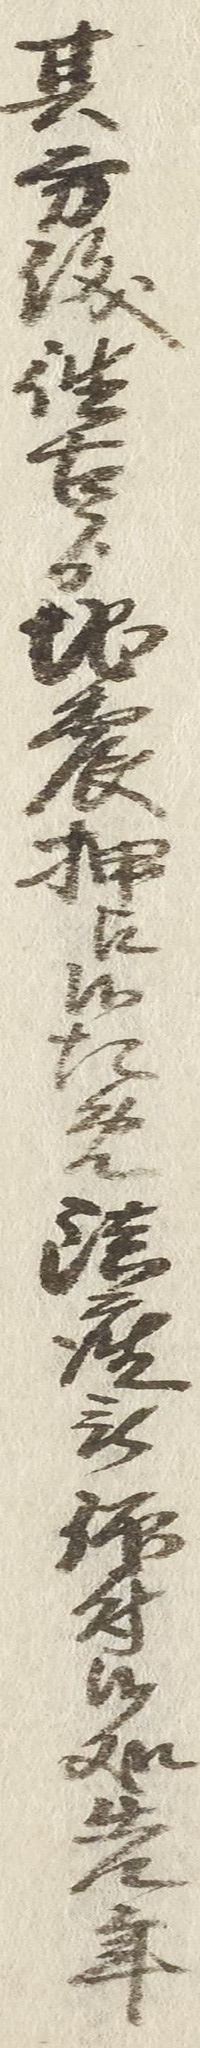其方儀往古ゟ地震押江候ため鎮座被仰付候所先年
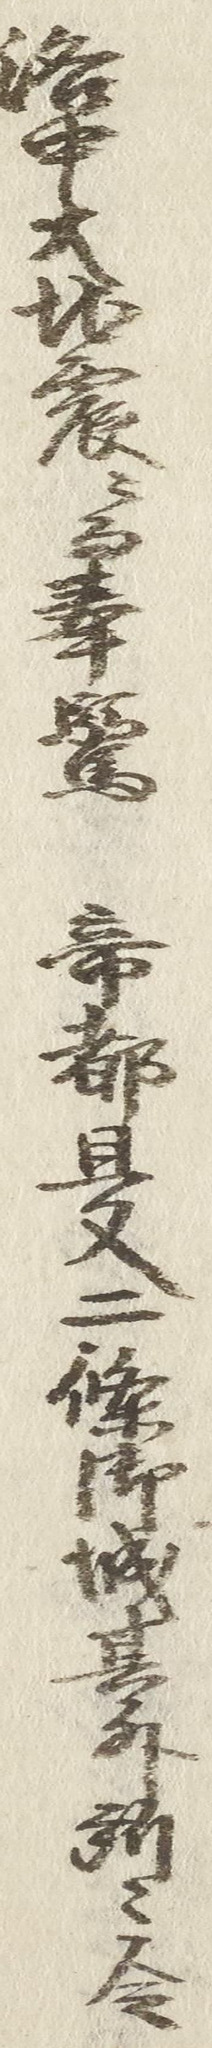洛中大地震二付奉驚帝都且又二条御城其外所々令
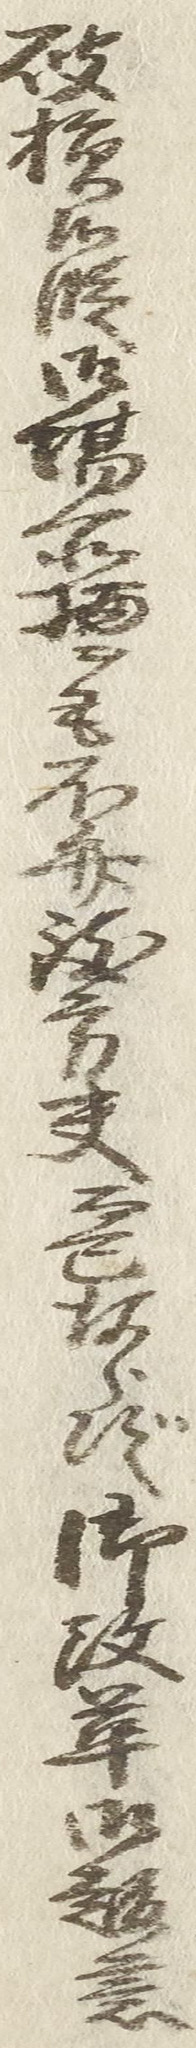破損候段御場所柄をも不弁致方其而巳ならず御政革御趣意
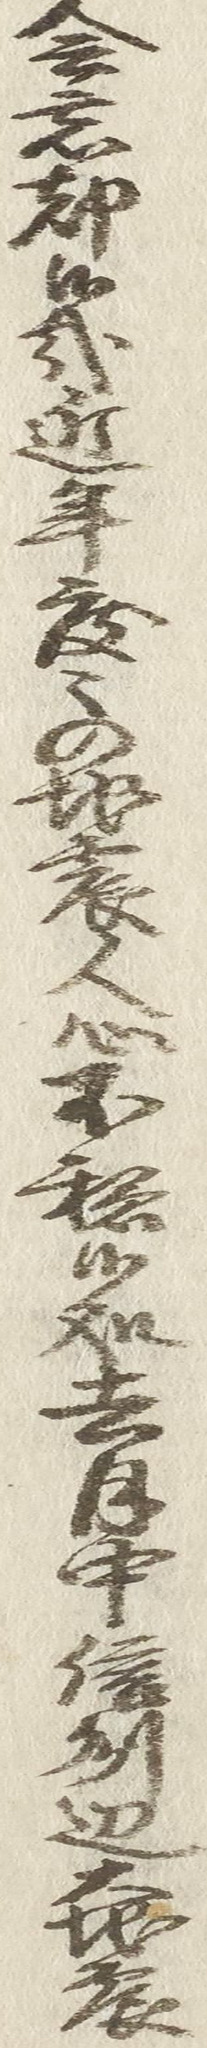会忘却候哉近年度々之地震人心不穏候処去月中信州辺大地震
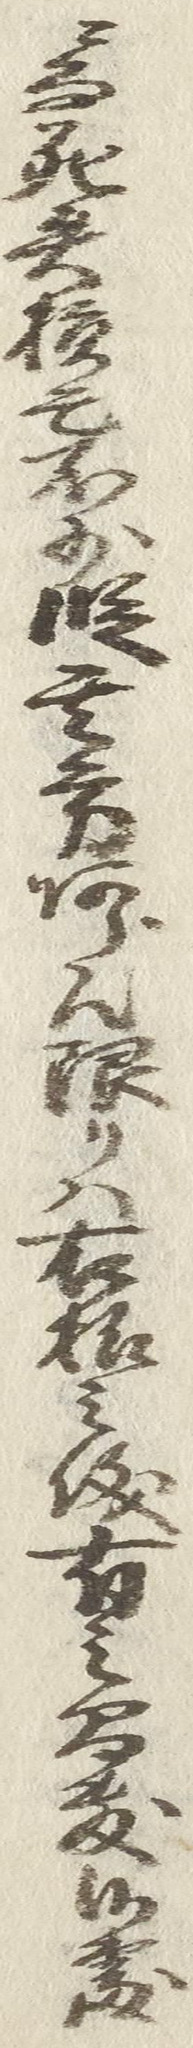二而死失損亡不少候段其方あらん限りは右様之儀有之間敷候処
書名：従往古地震御届書記誌之一
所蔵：東京大学地震研究所図書室 Earthquake Research Institute Library, The University of Tokyo, JAPAN
